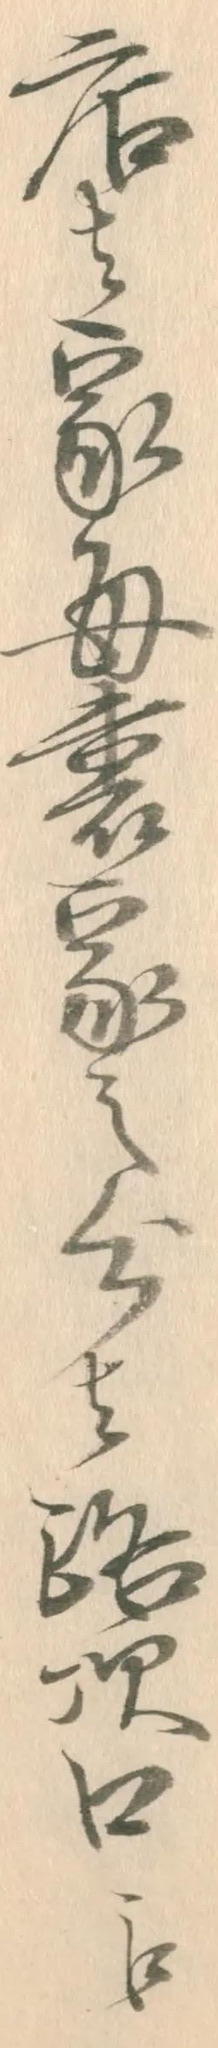店は家毎裏家之分は路次口え
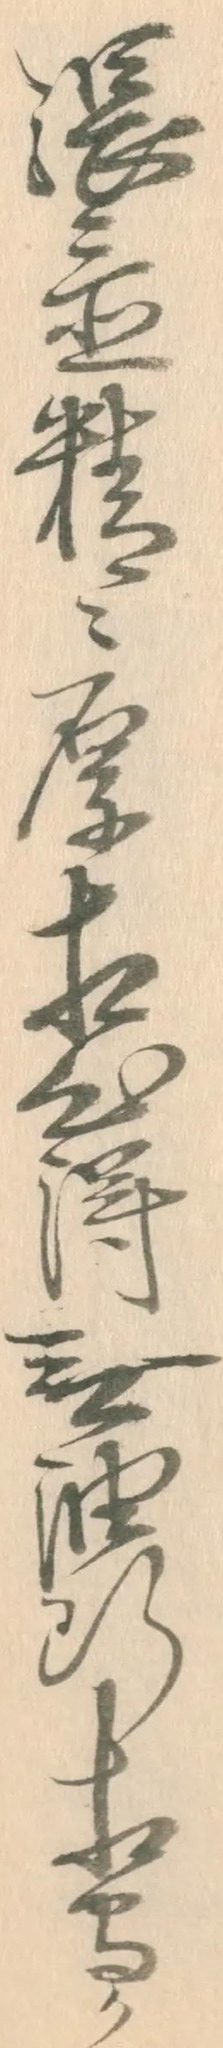張置精々厚相心得無油断相守り
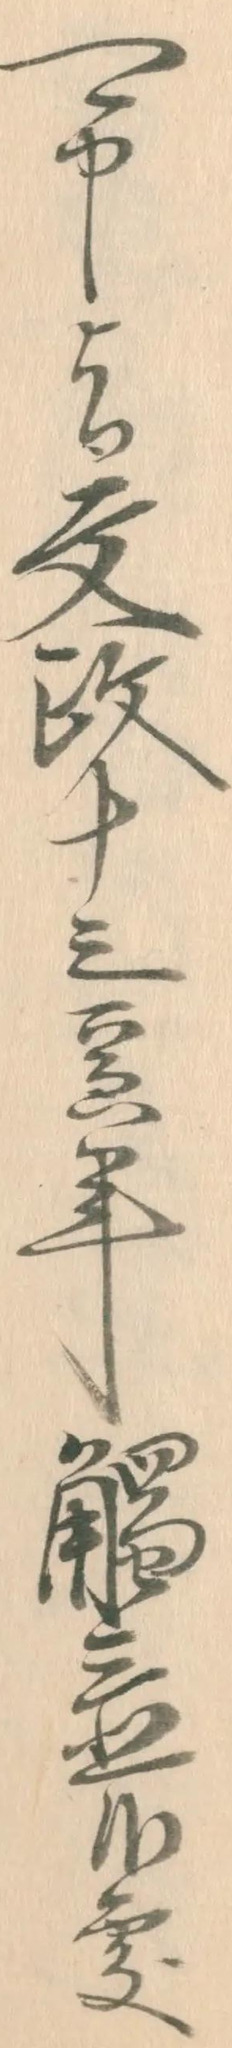可申旨文政十三寅年触置候処
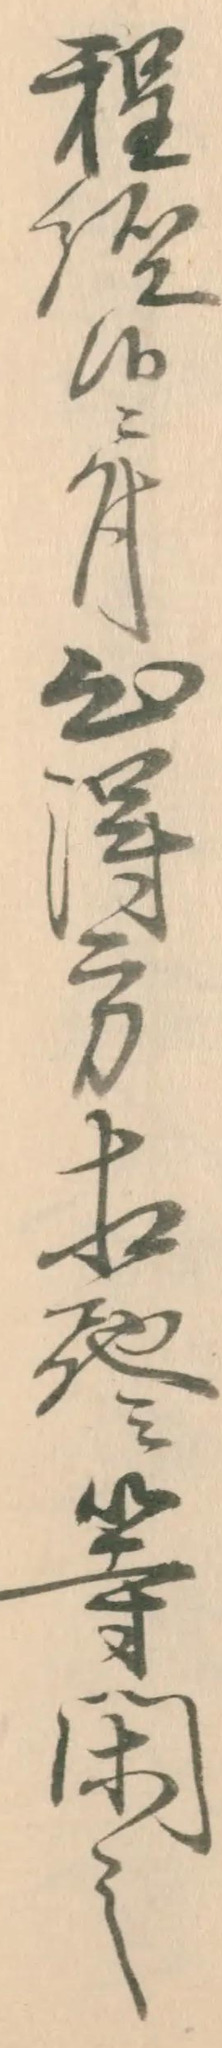程経候ニ付心得方相弛ミ等閑之
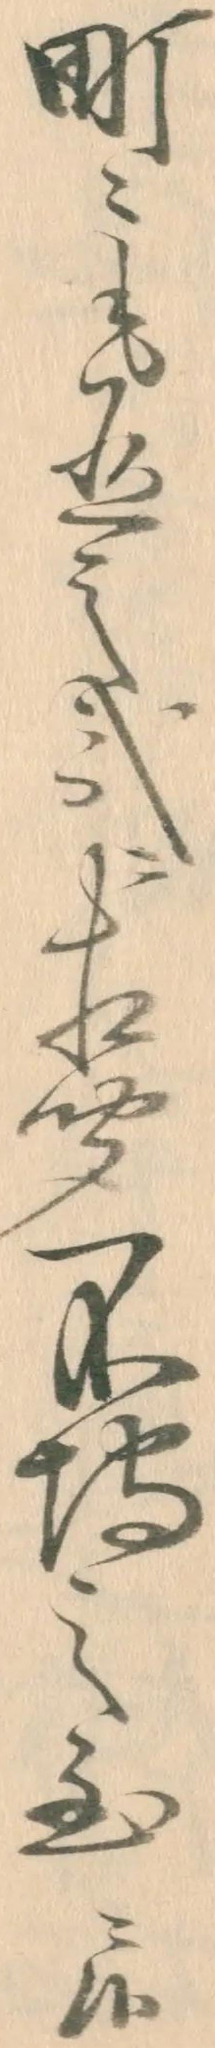町々も有之哉ニ相聞不埒之至ニ候
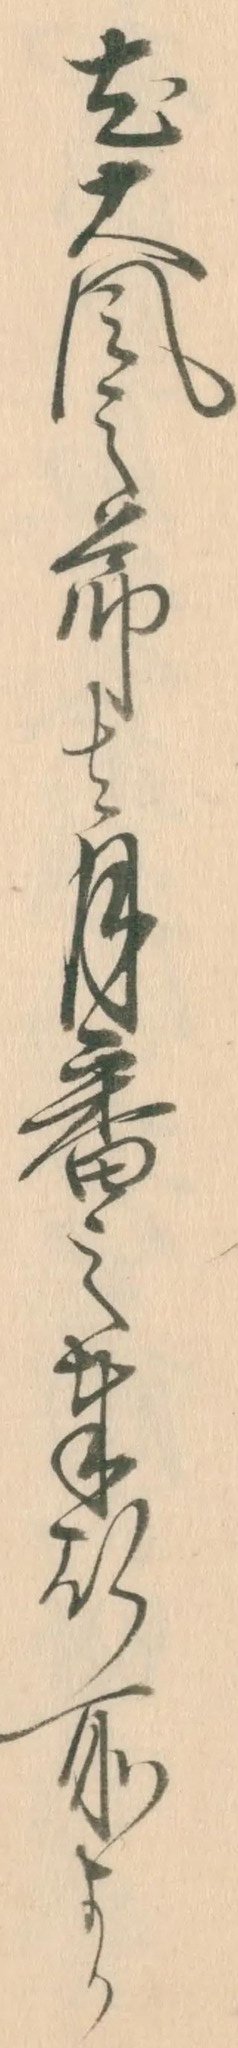尤大風之節は月番之奉行所より
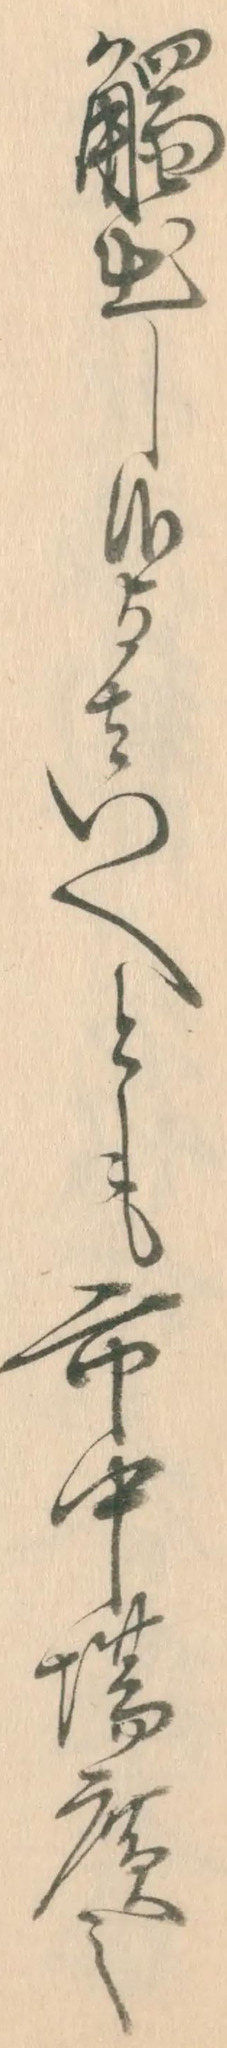触出し候とはいへとも市中場広之
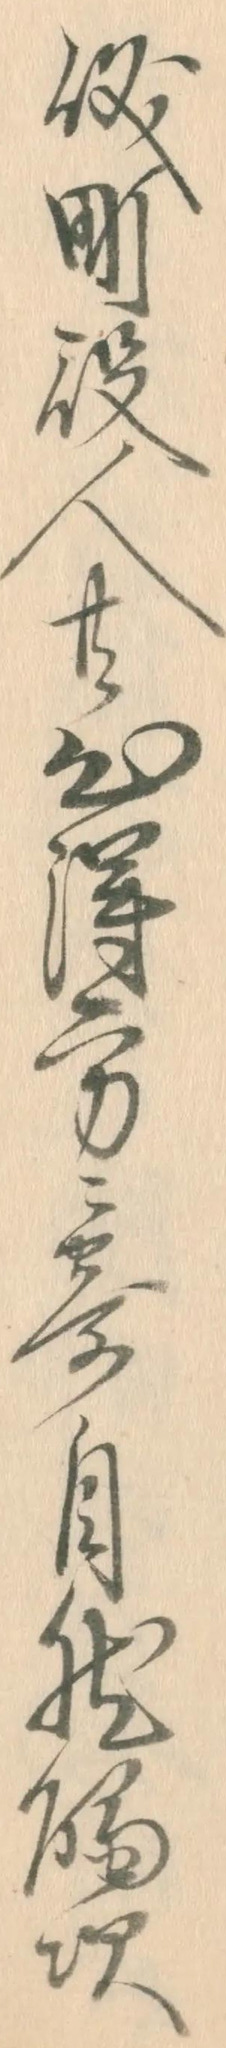儀町役人共心得方ニ寄自然触次
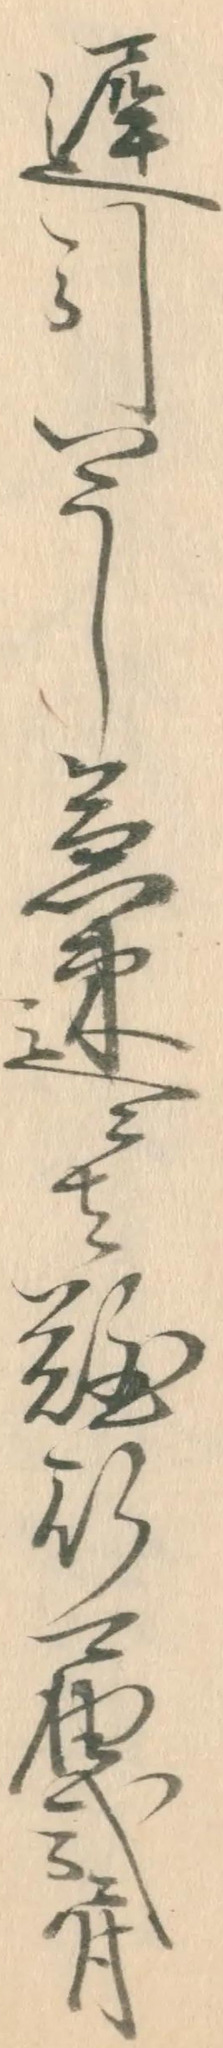遅延いたし急速ニは難行届哉ニ付
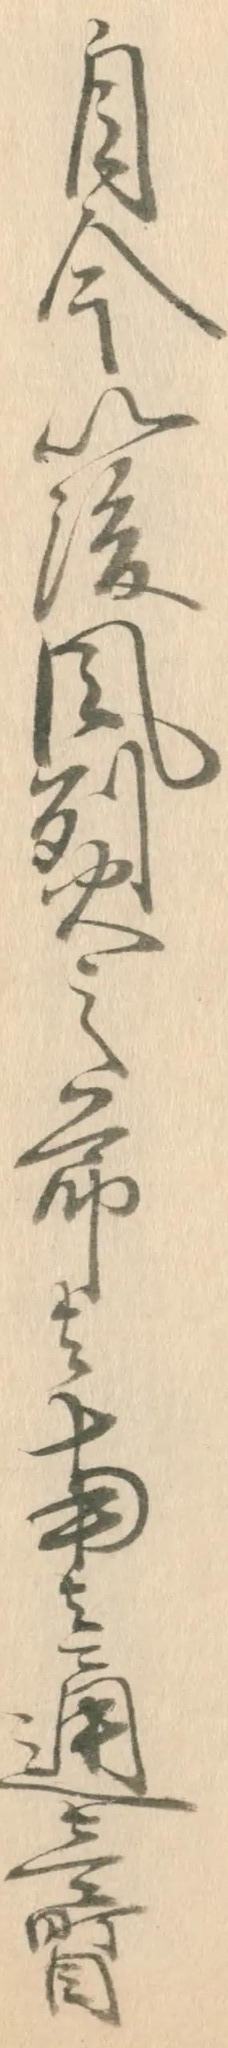自今以後風烈之節は南は通壱町目

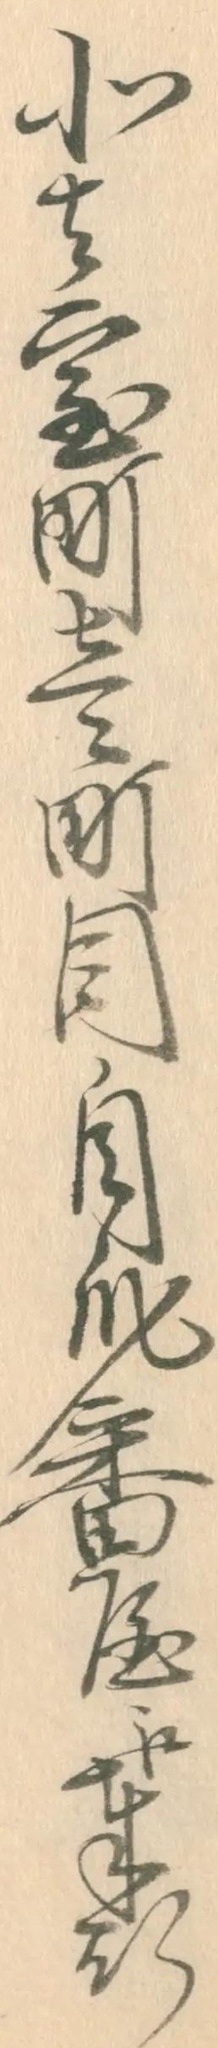北は室町壱町目自身番屋え奉行
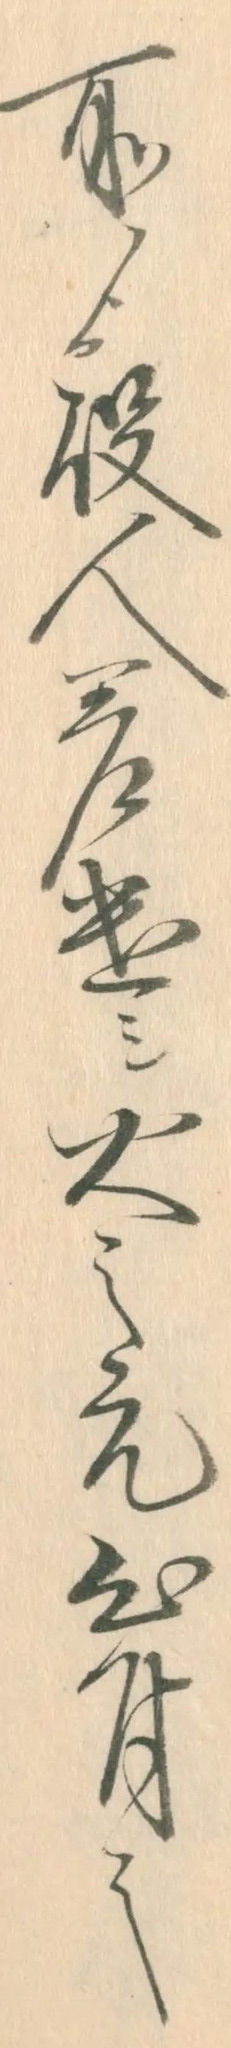所ゟ役人差遣シ火之元心付之
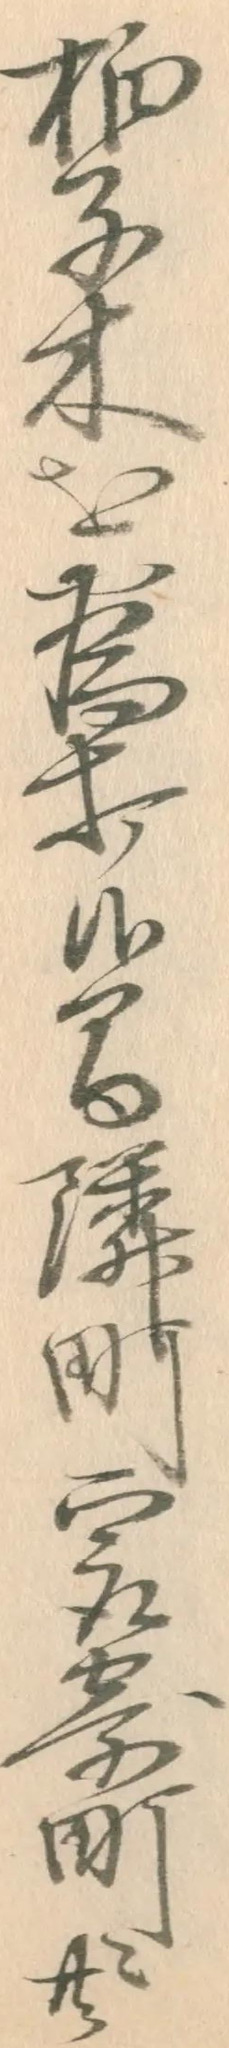拍子木を為打候間隣町最寄町々共
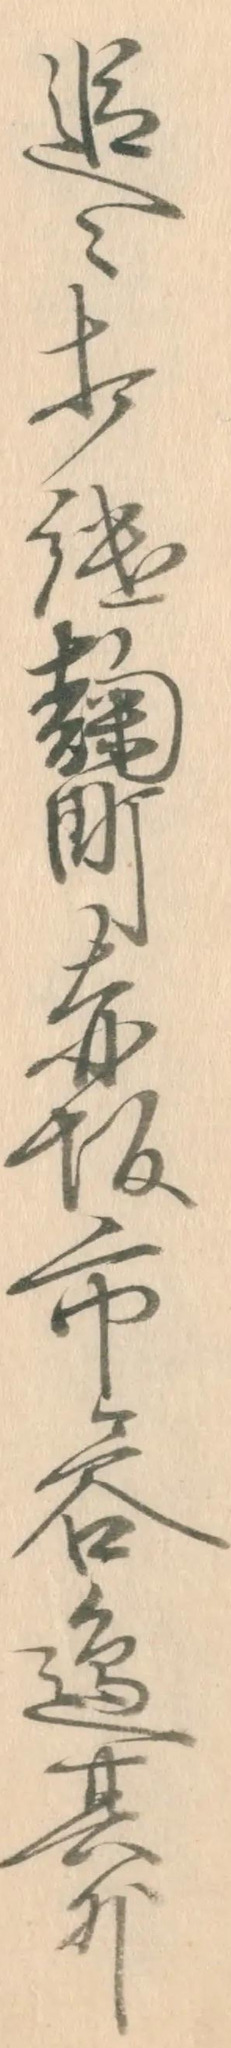追々打継麹町赤坂市ケ谷辺其外
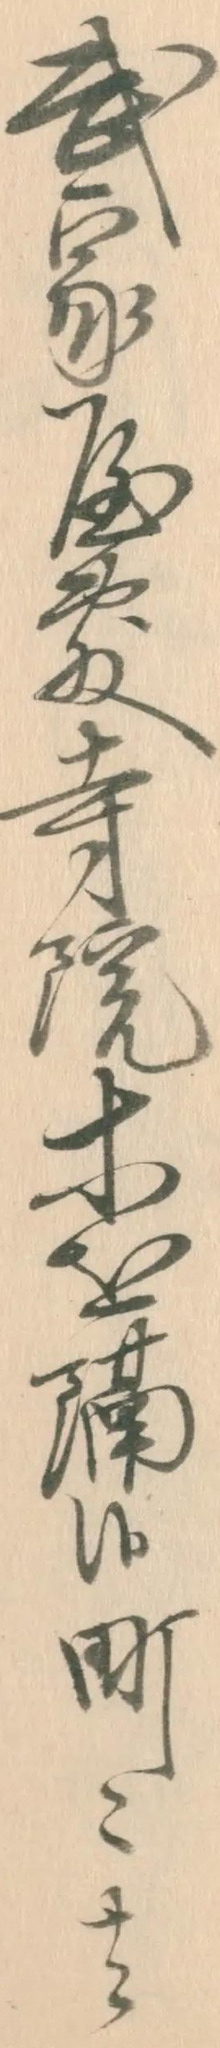武家屋敷寺院等を隔候町々は
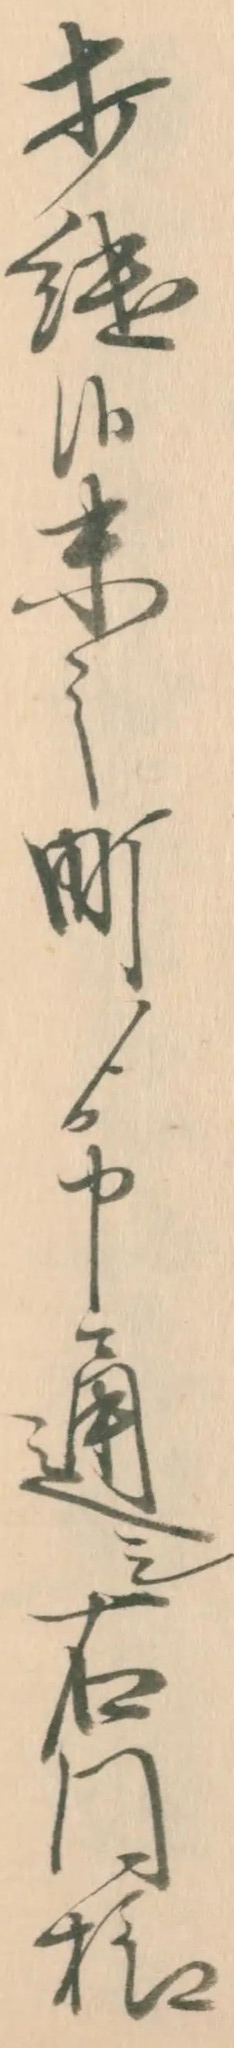打継候末之町ゟ申通シ右同様
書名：三橋 17巻. [7] 三橋小破御修復書留　但御奉行御掛リ替地震潰橋番屋　嘉永四亥年より安政二卯年迄　上
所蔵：国立国会図書館 National Diet Library, JAPAN
